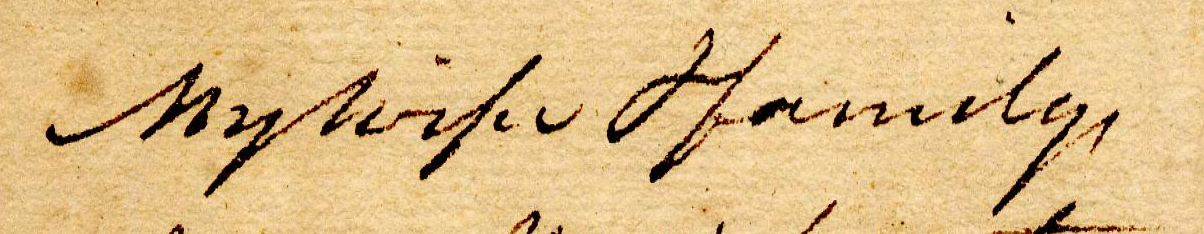My wife & familys
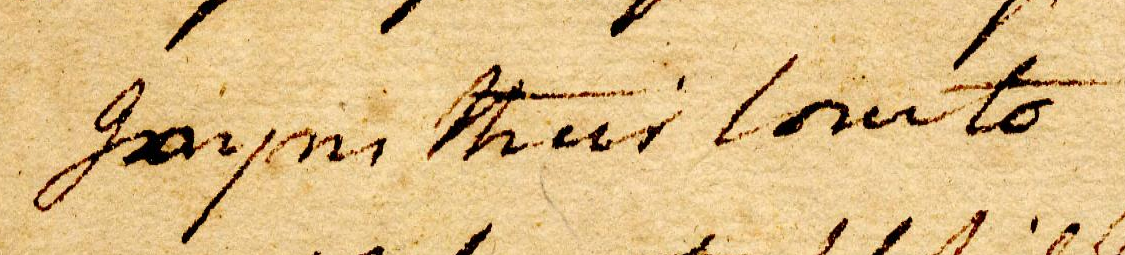Joyns their love to
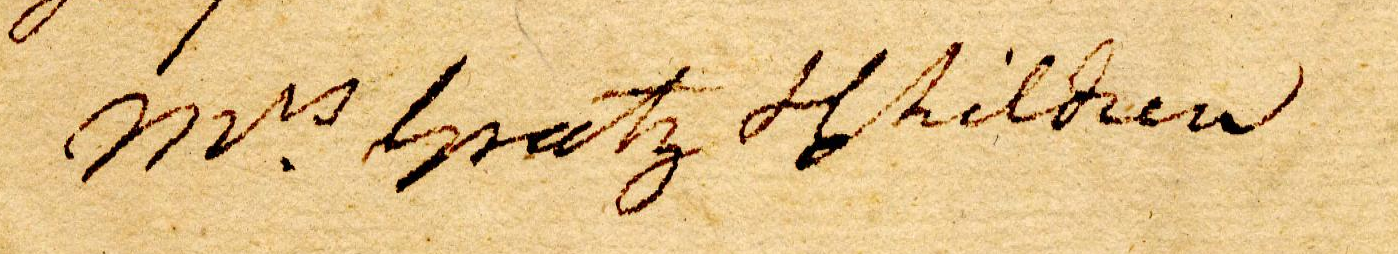M^rs. Gratz & children
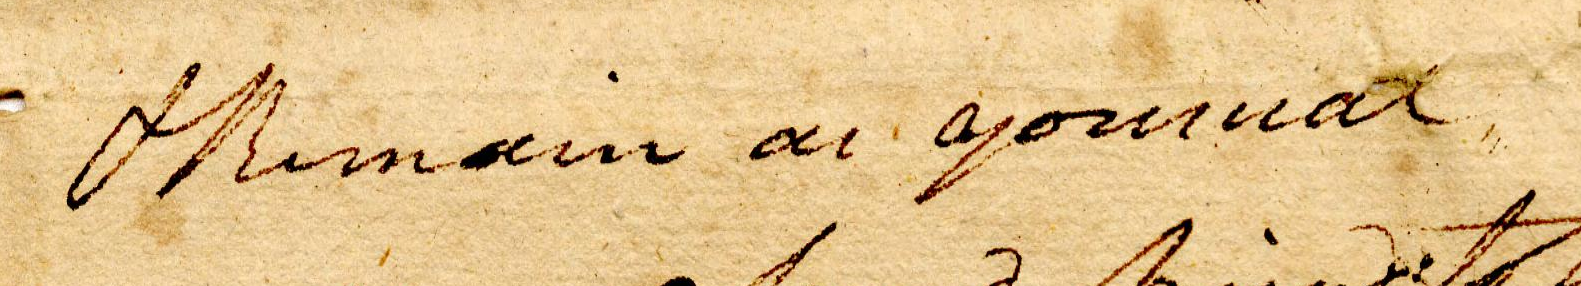& Remain as your usual
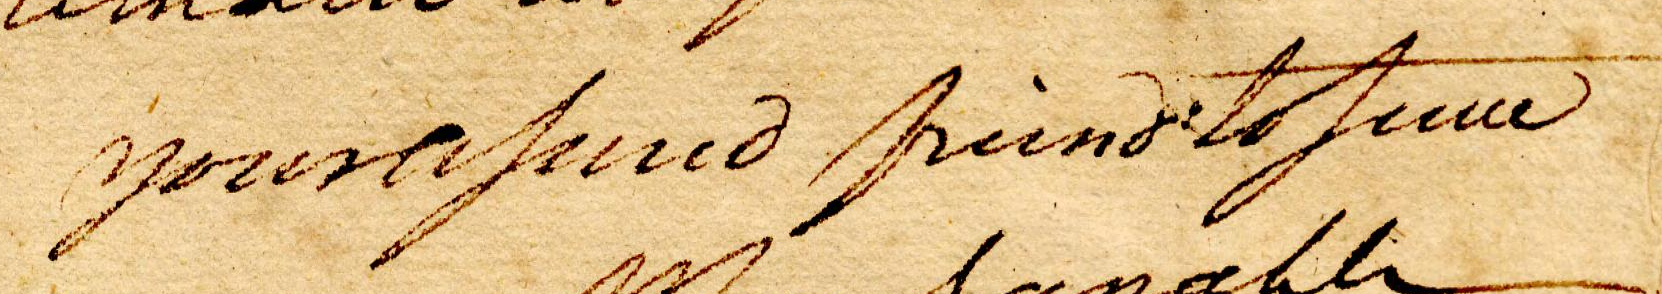your asured friend to serve
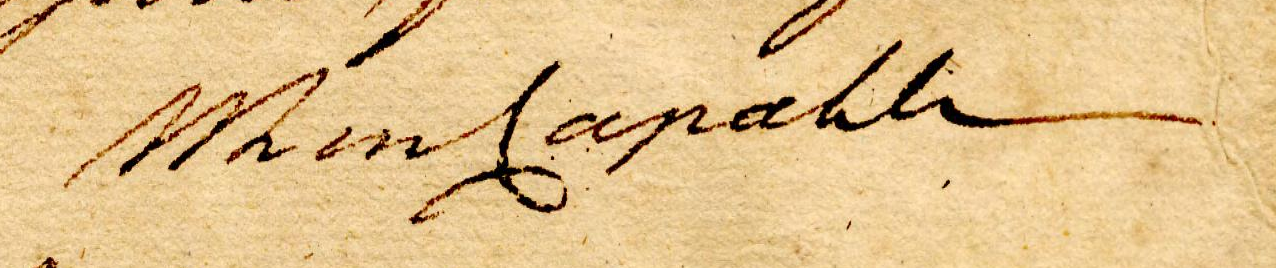When Capable
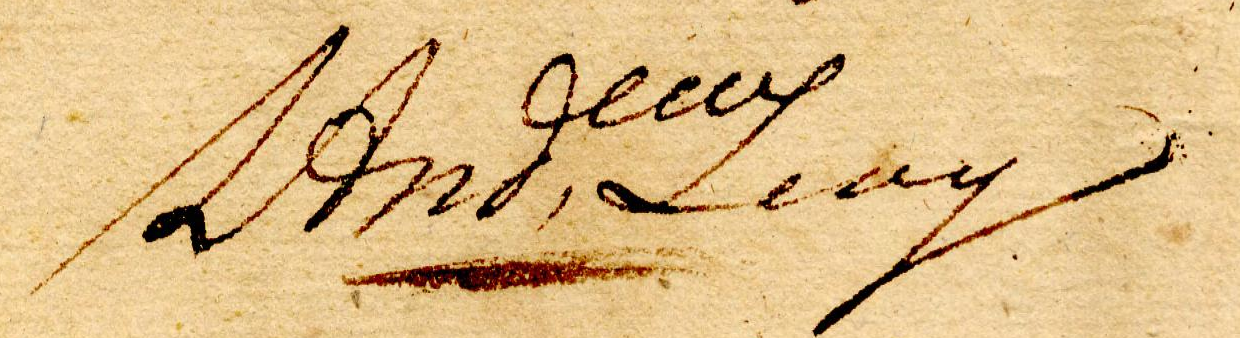And^rew Levy
